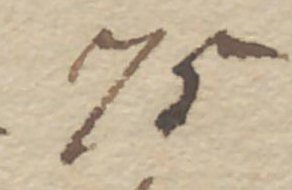75
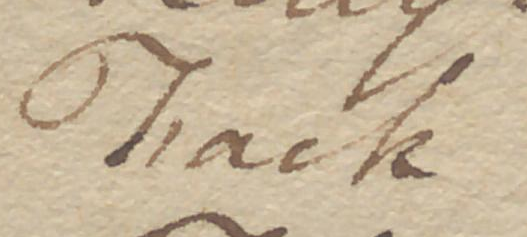Track
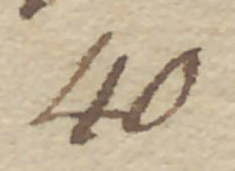40
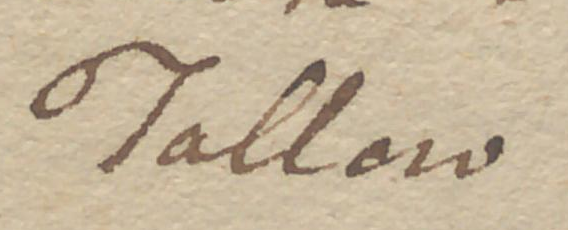Tallow
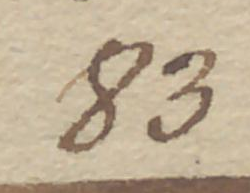83
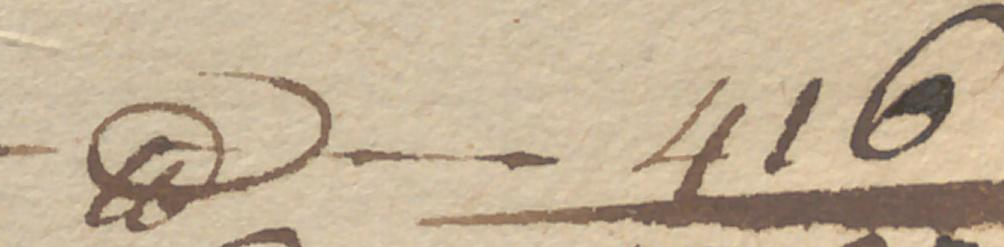@ 416
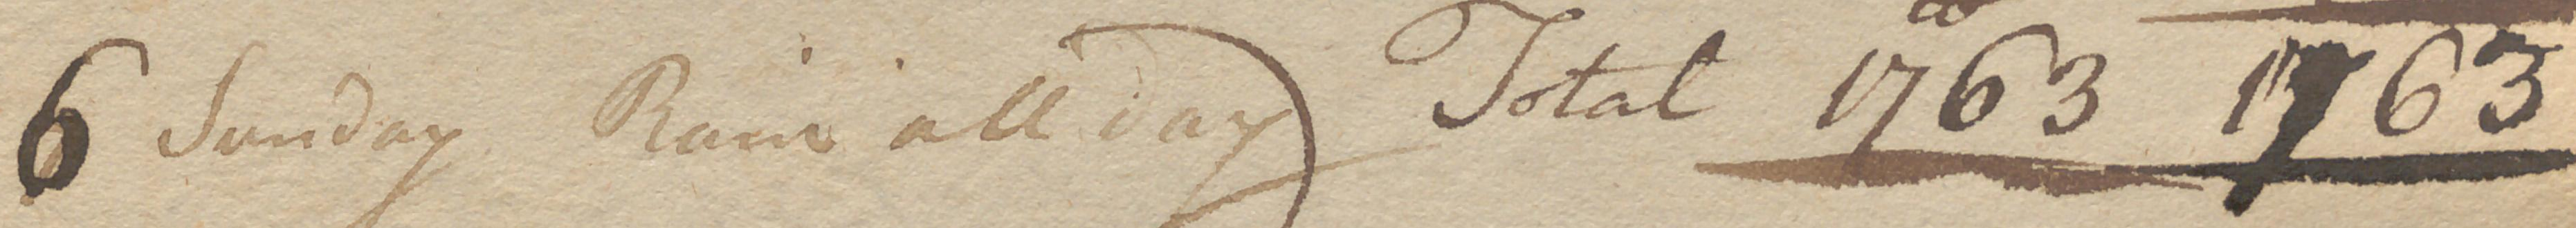6 Sunday Rain all day Total 1763 1763
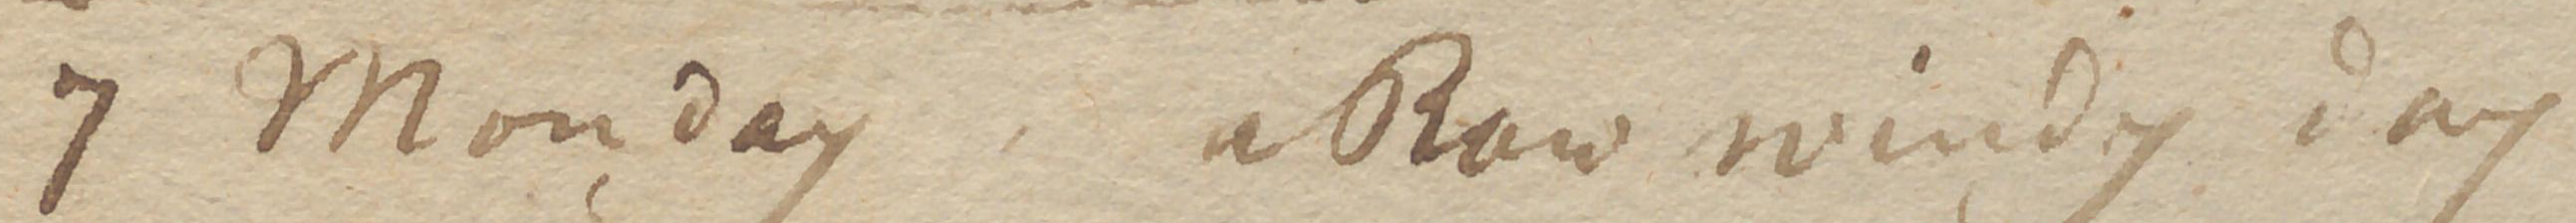7 Monday, a Raw windy day
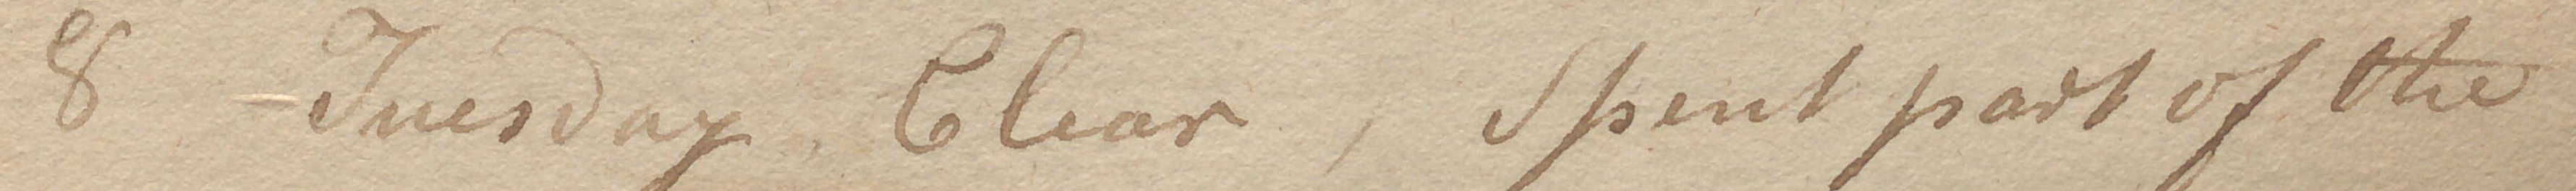8 Tuesday Clear, spent part of the
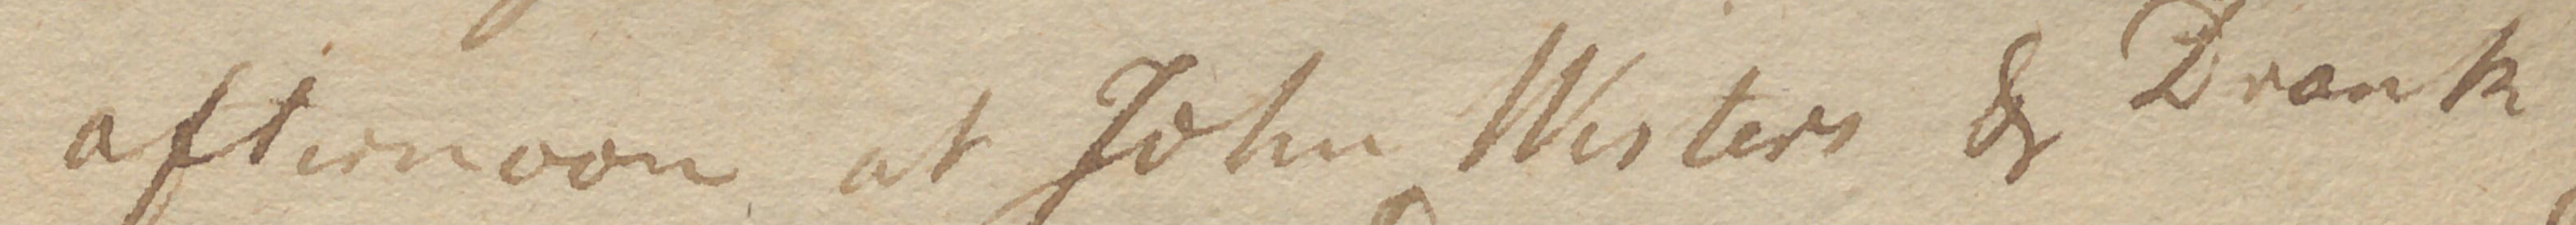afternoon at John Wisters & Drank
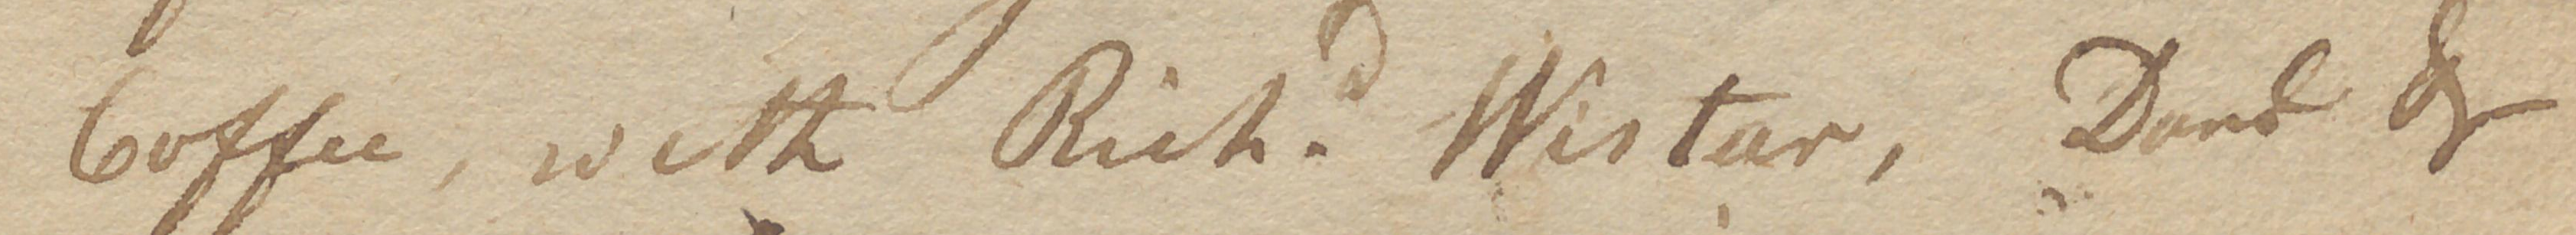Coffee, with Rich^d. Wistar, Dan^l &
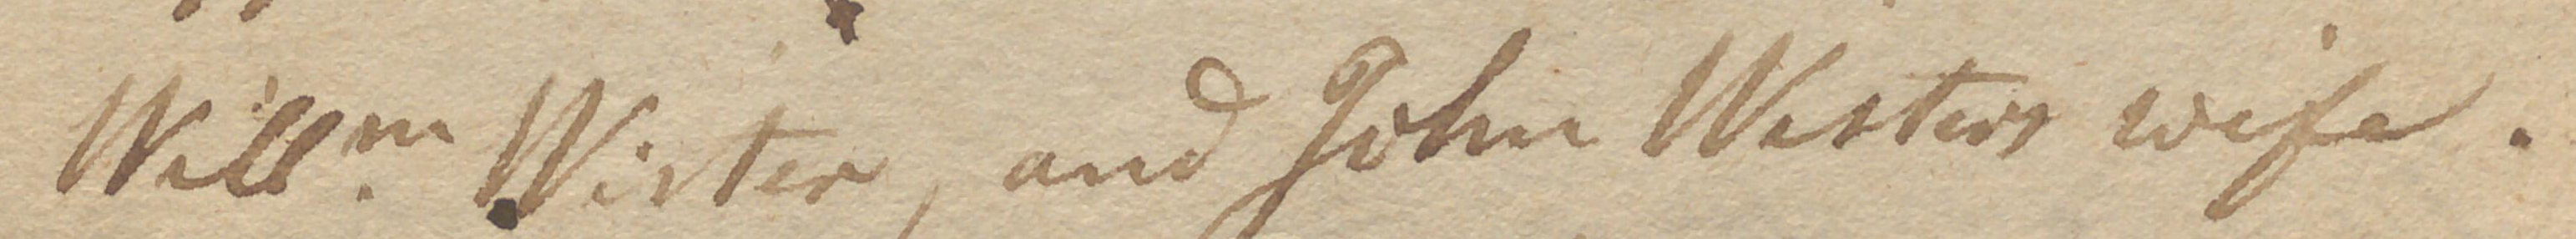Will^m. Wister, and John Wisters wife.
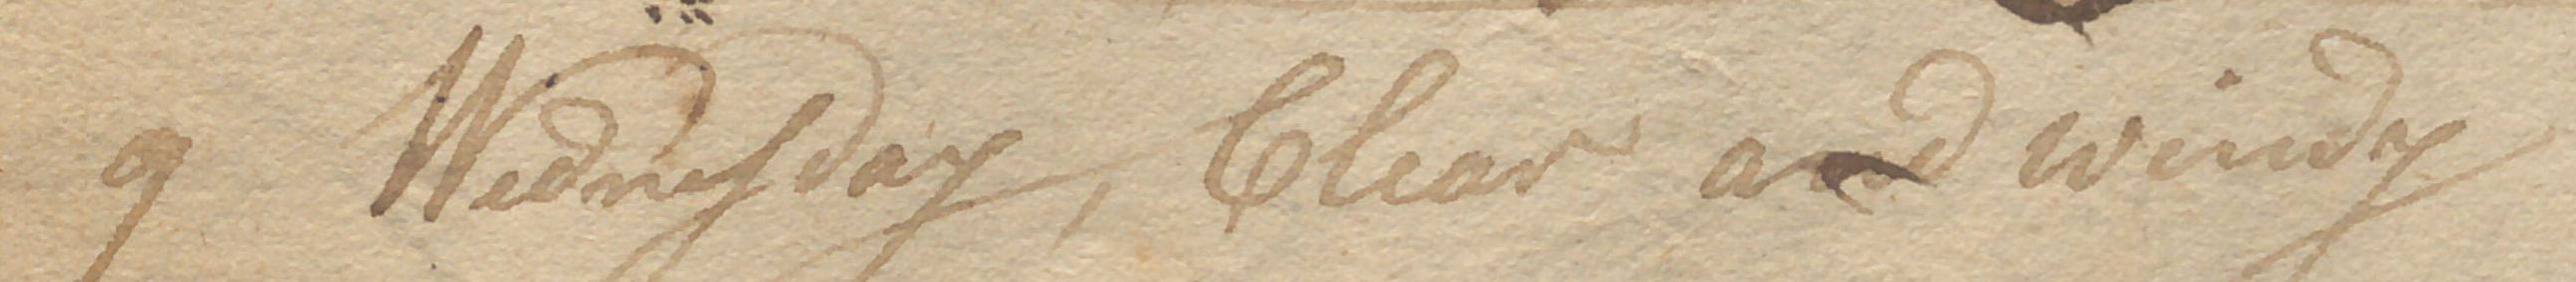9 Wednesday, Clear and windy
